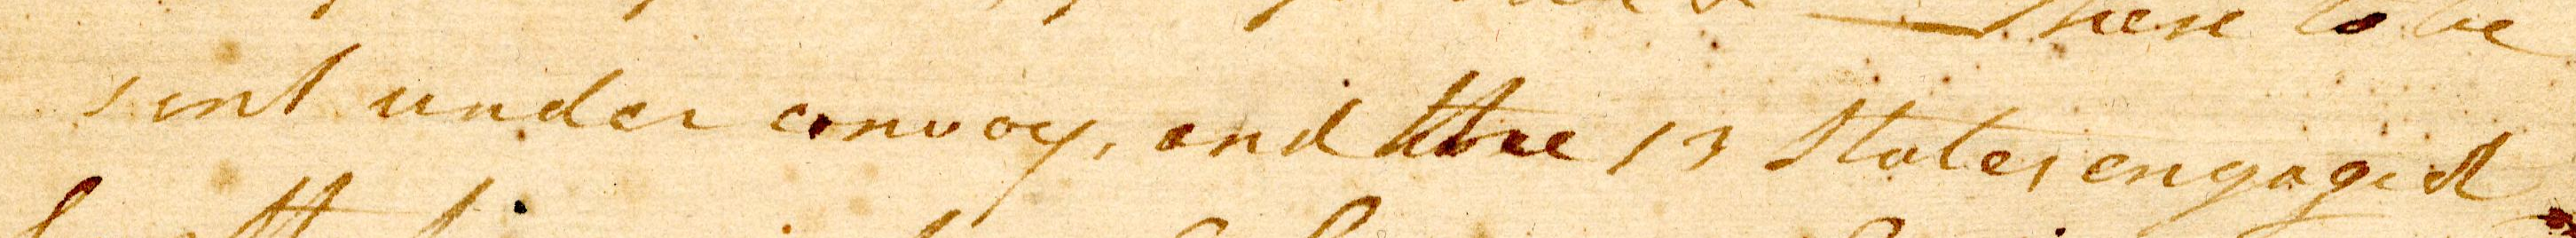sent under convoy, and the 11 States engaged
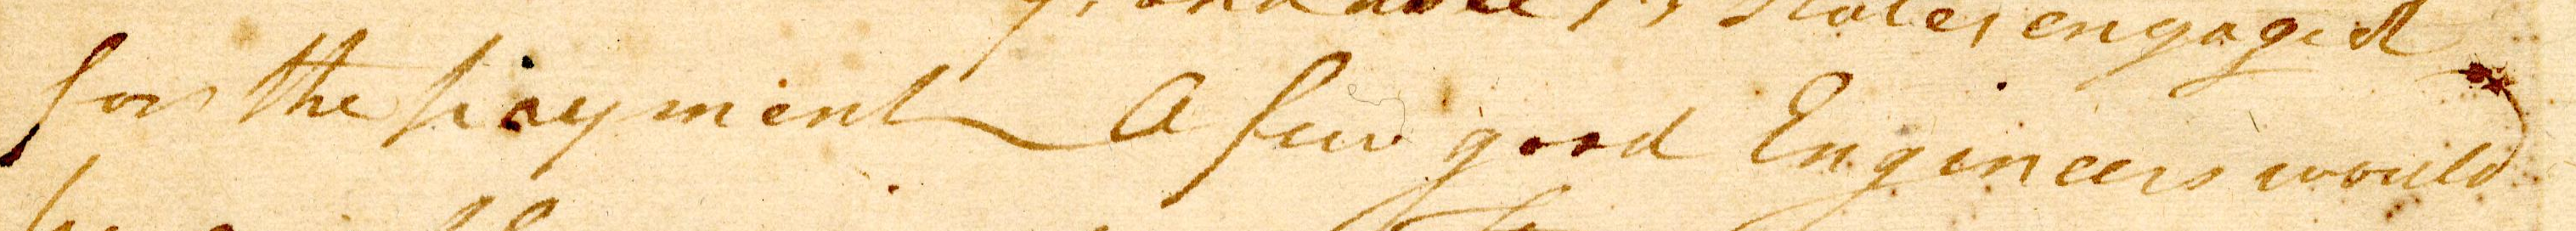for the Payment- A few good Engineers would
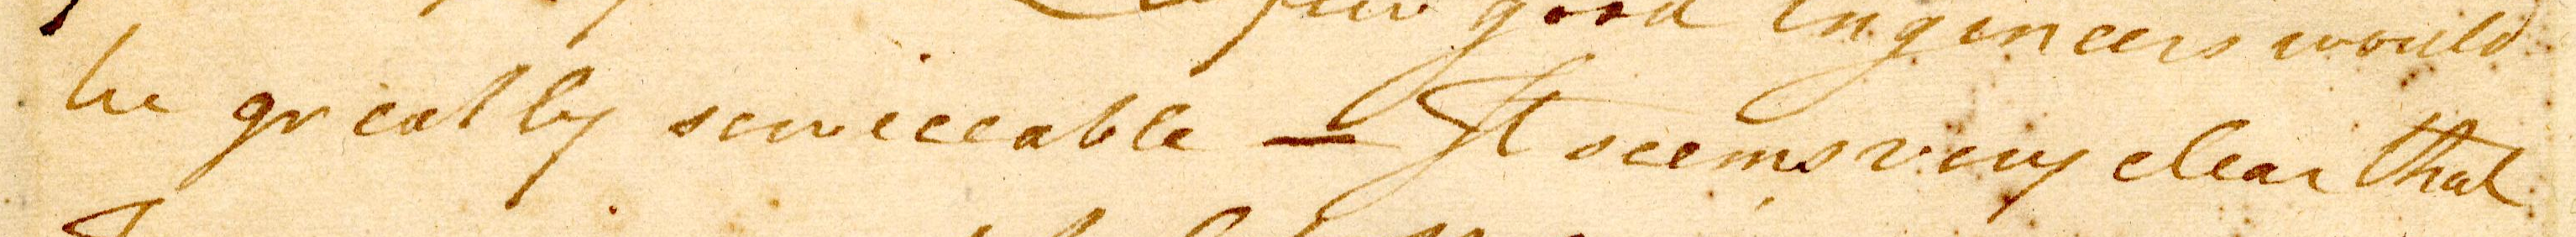be greatly serviceable- It seems very clear that
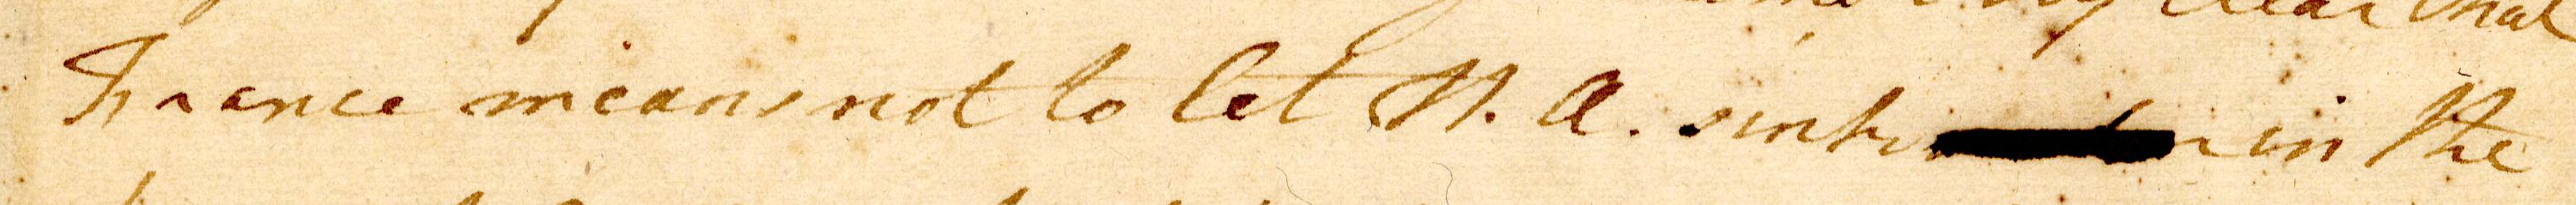France means not to let N. A. sink [____] in the
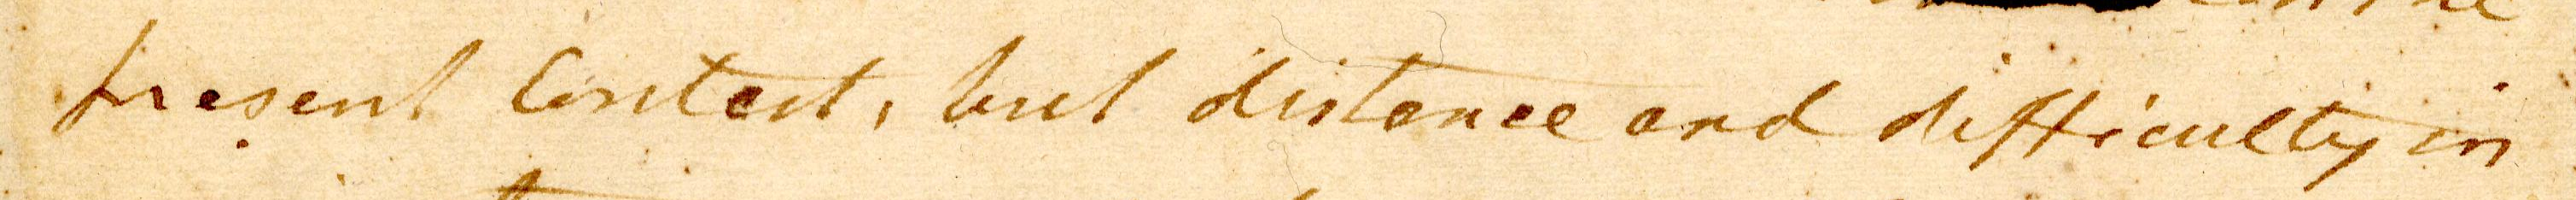present Contest, but distance and difficulty in
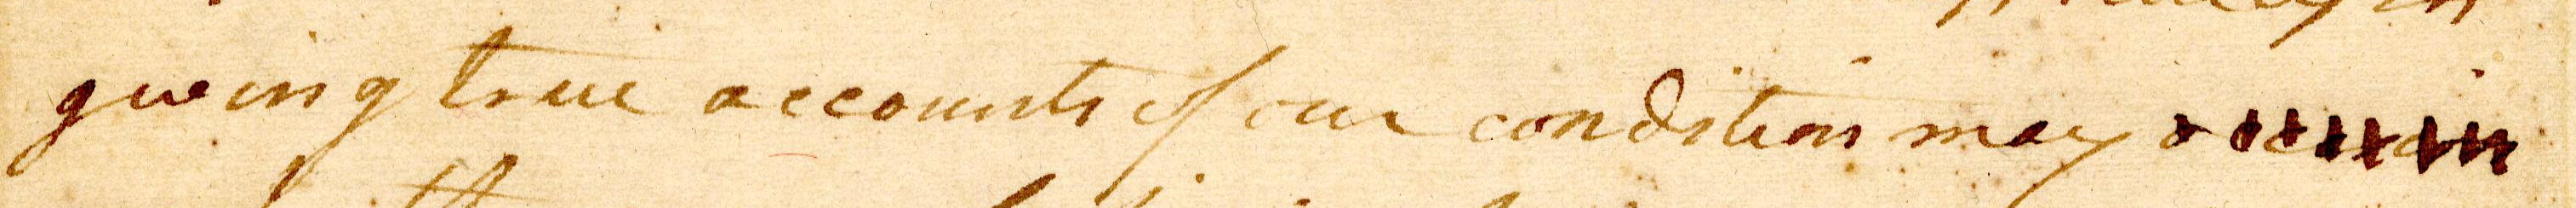giving true accounts of our condition may [_____]
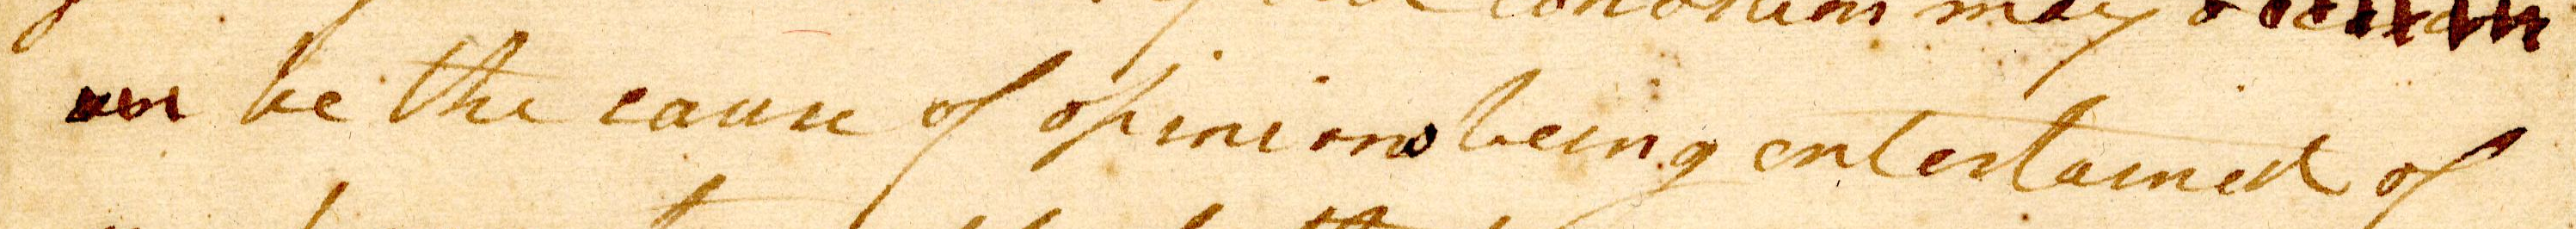[__] be the cause of opinions being entertained of
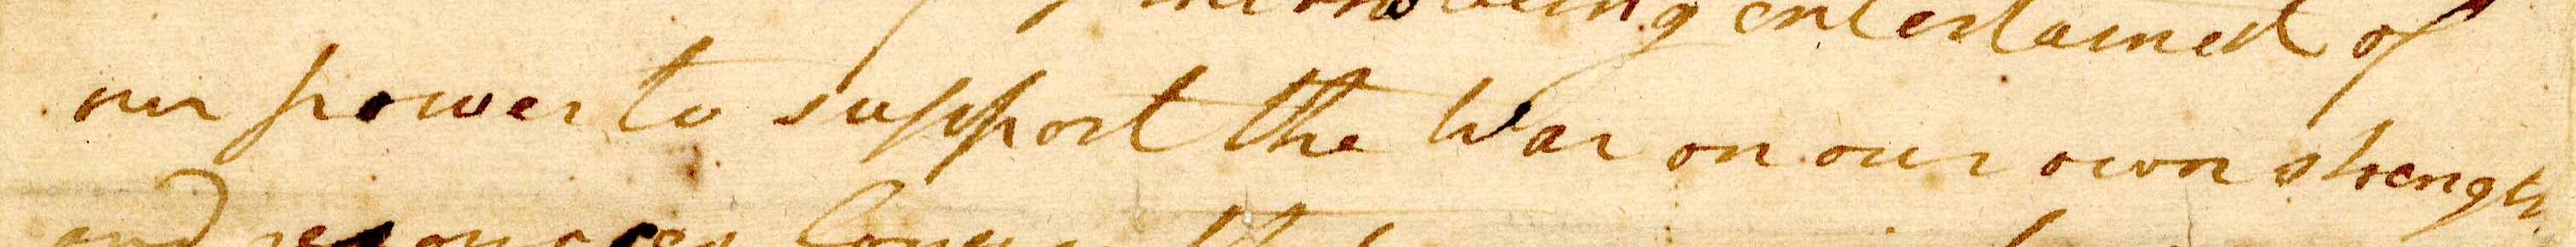our power to support the War on our own strength
